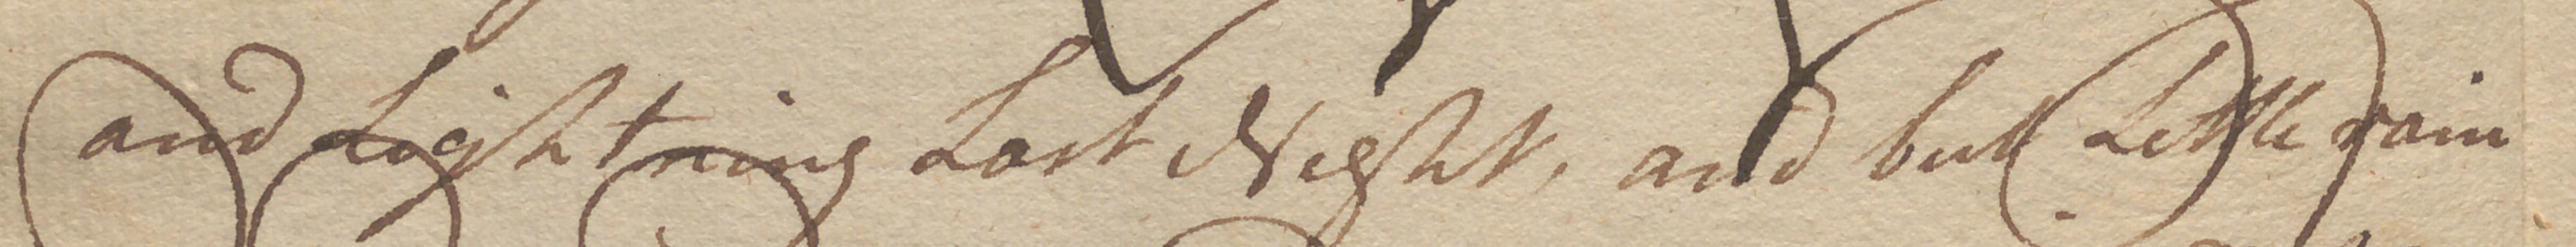[and Lightning Last Night, and but Little rain]
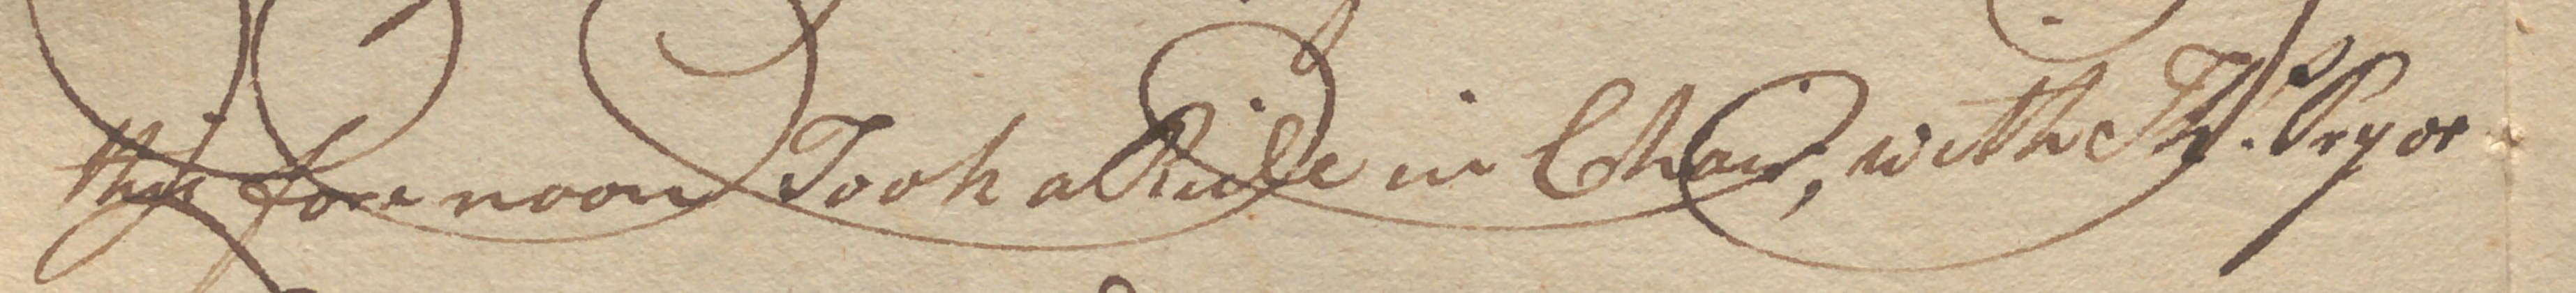[this forenoon Took a Ride in Chair, with Th^s. Pryor]
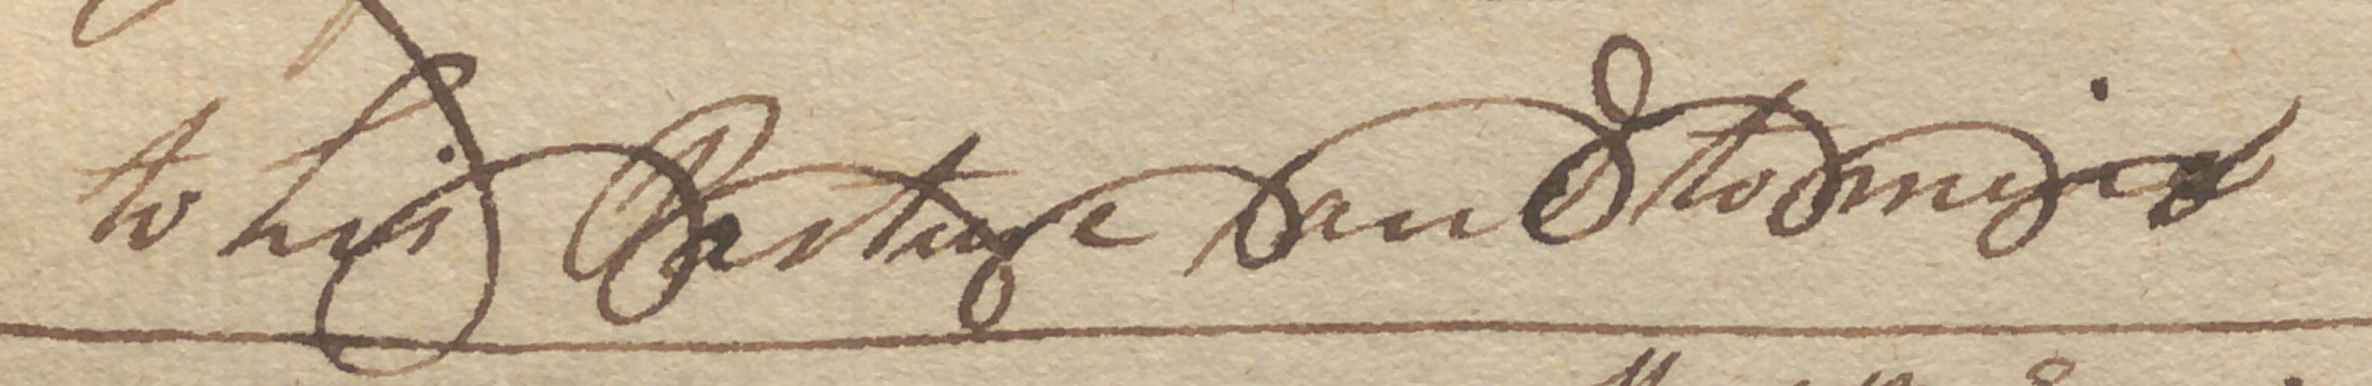to his Pasture and to mine
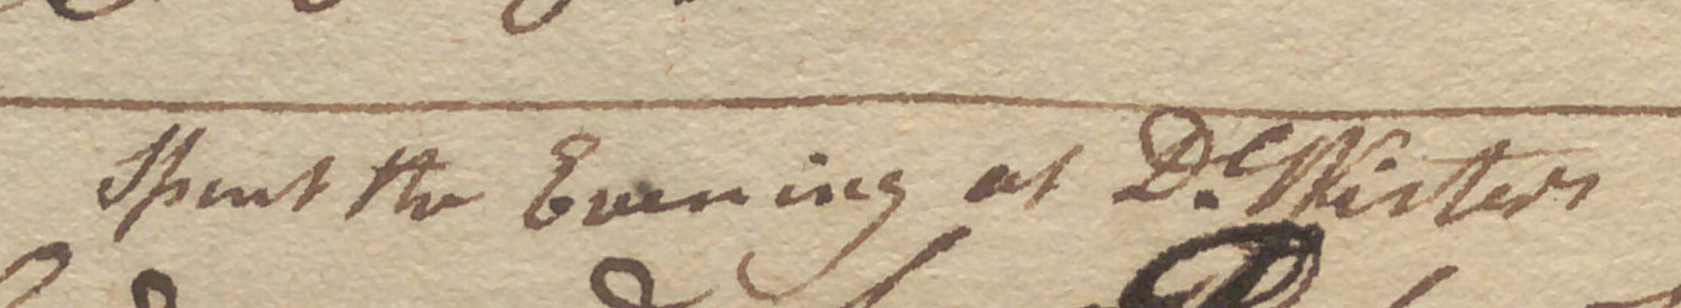spent the Evening at D^l. Wisters
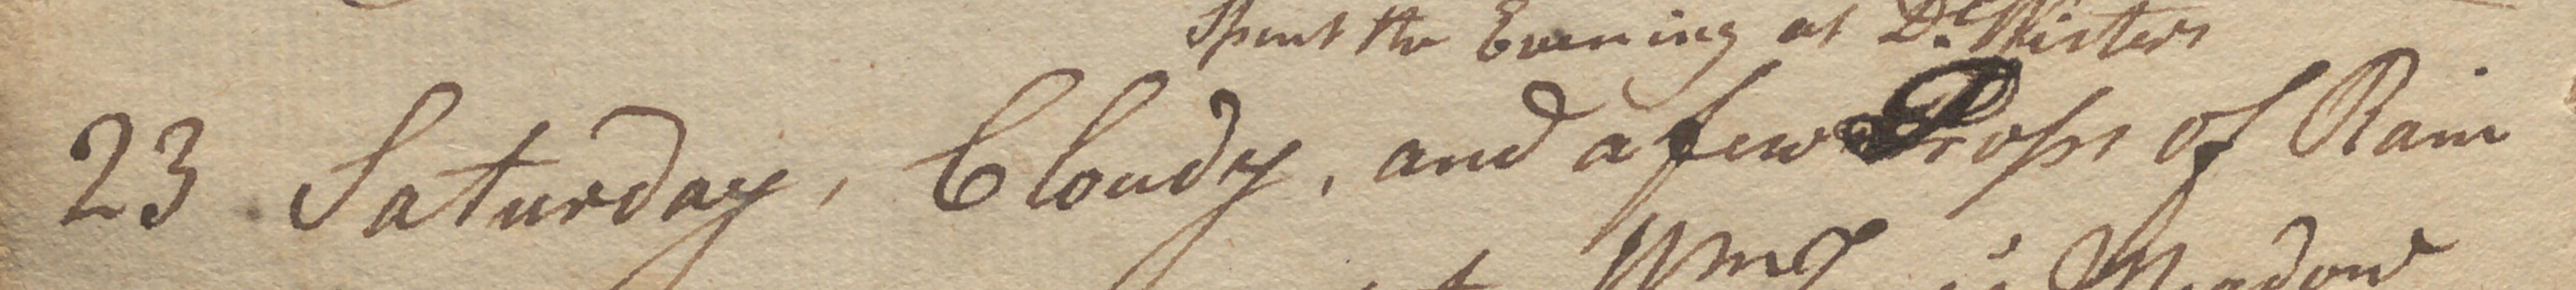23 Saturday, Cloudy, and a few Drops of Rain
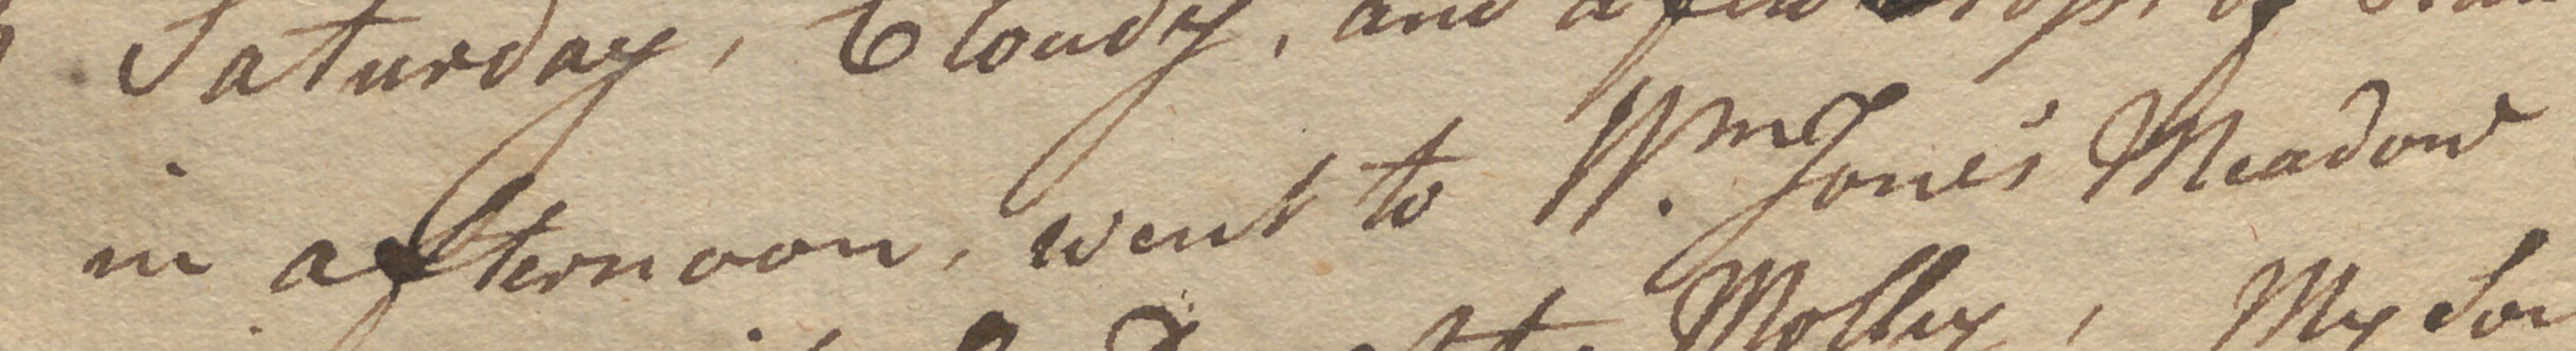in afternoon. went to W^m. Jones' Meadow
